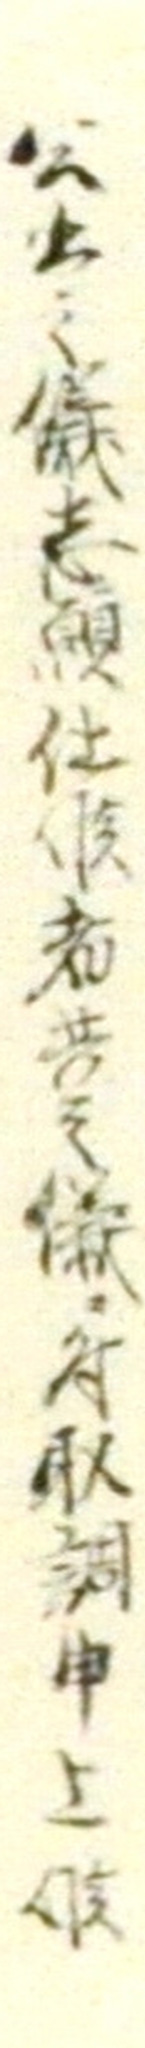公出之儀志願仕候者共之儀ニ付取調申上候
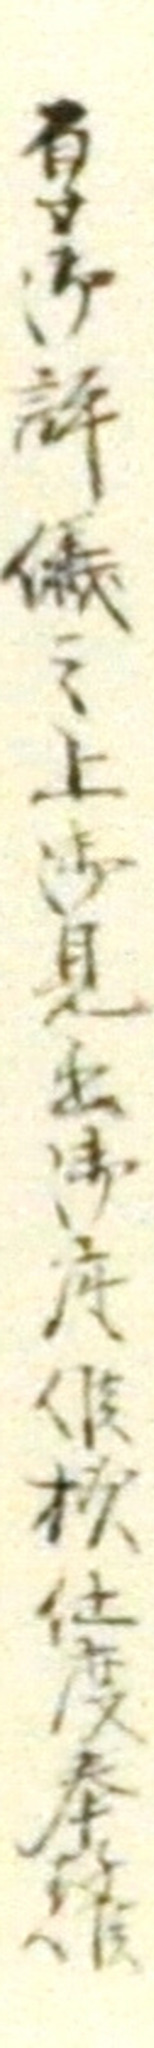厚御評儀之上御見出御座候様仕度奉存候

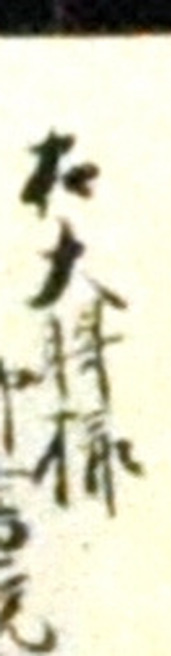右大将様
